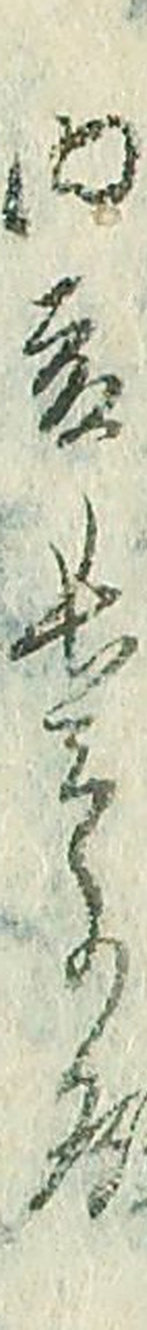内藤長三郎殿
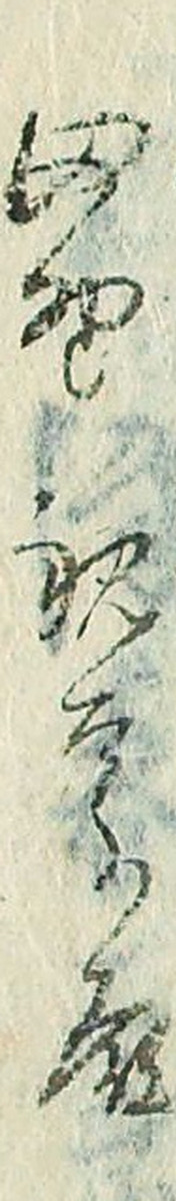田野祐太郎殿

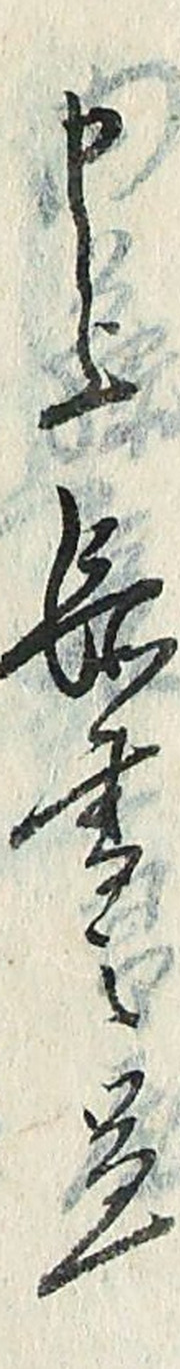申上添書之覚
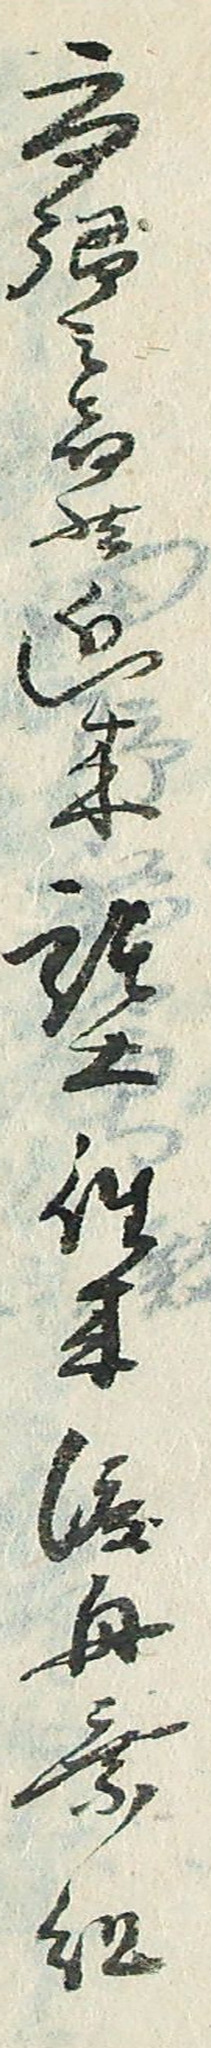市郷之者共近来諸士往来渡舟乗組
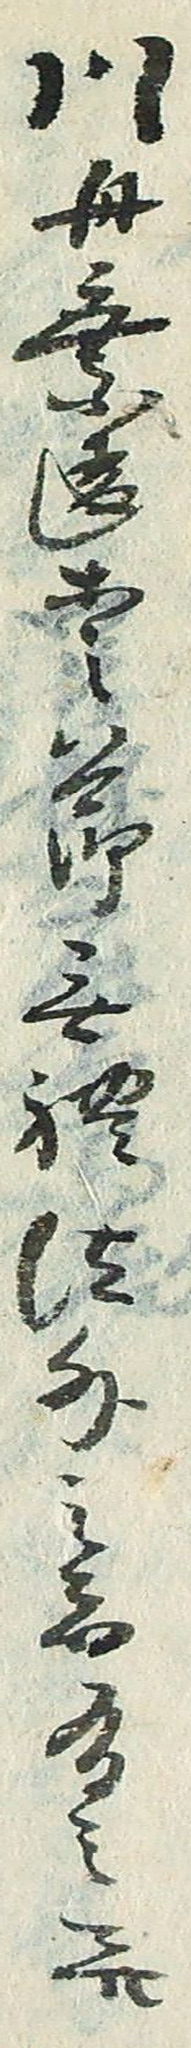川舟乗違等之節無礼法外之者有之幷
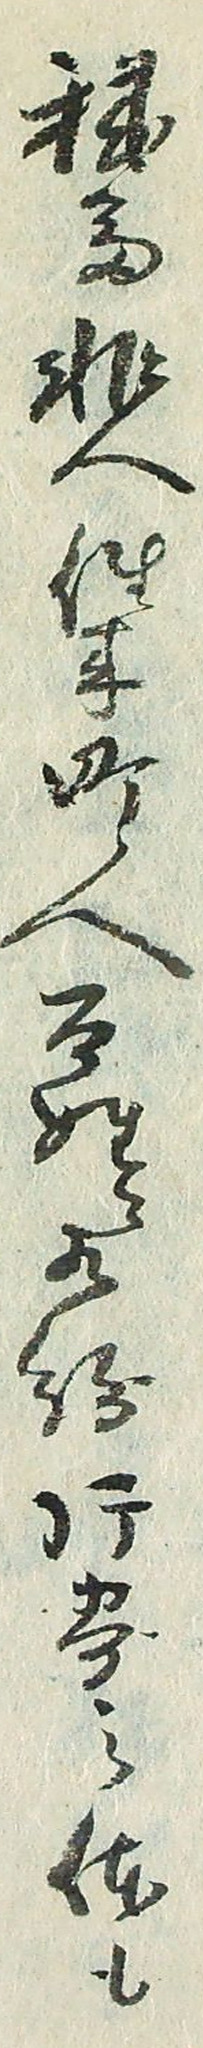穢多非人往来町人百姓に相紛片寄之体も
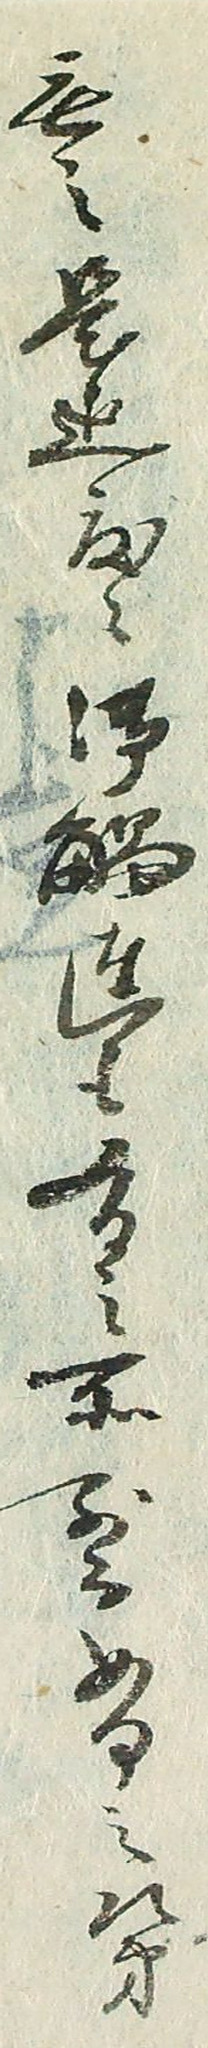無之是迄度々御触達も有之所別而如何之次第
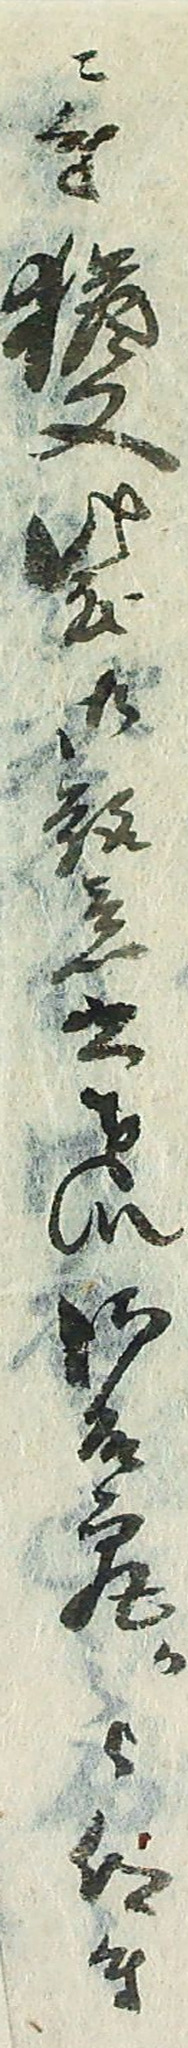に付猶又此度御趣意書を以御取究り被仰付
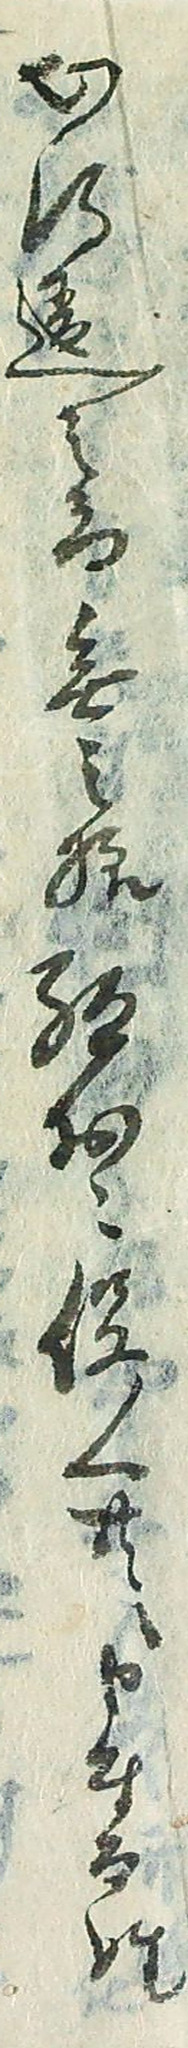心得違之者無之様組村々役人共へ申付百姓
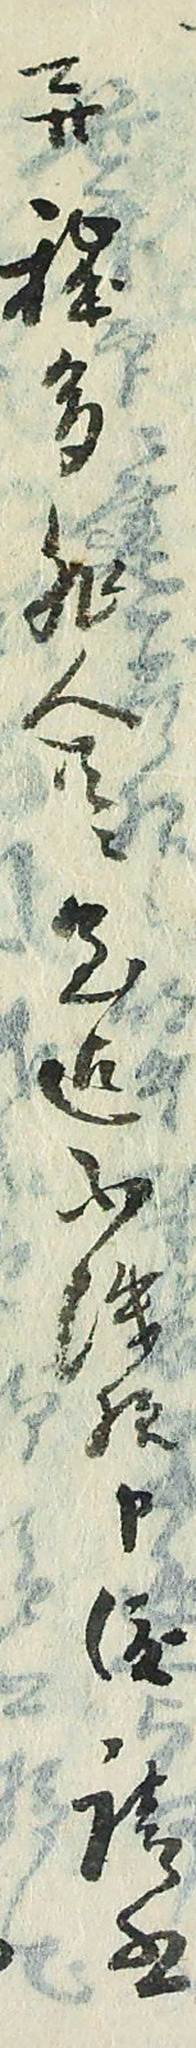幷穢多非人共に至迄不洩様申渡請書
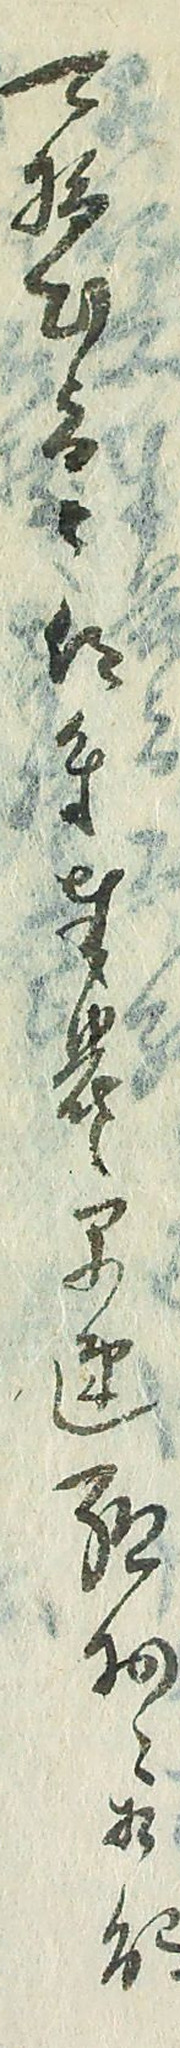可指出旨被仰付奉畏候早速組村々相触
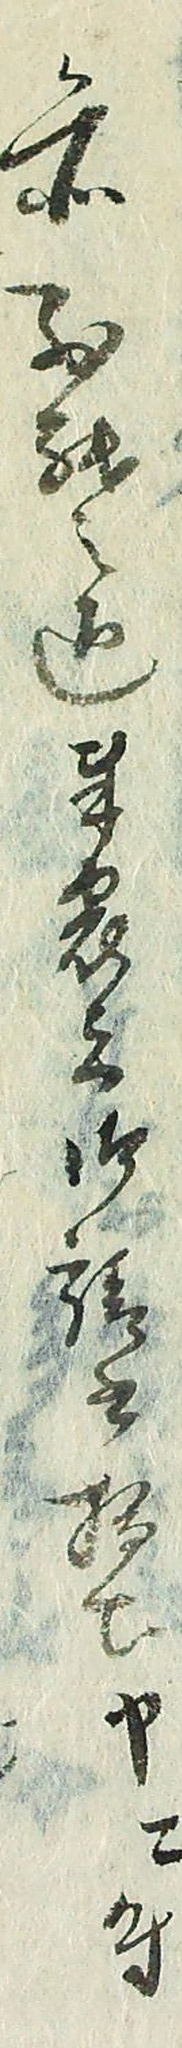候所別紙之通奉畏旨御請書指出申に付
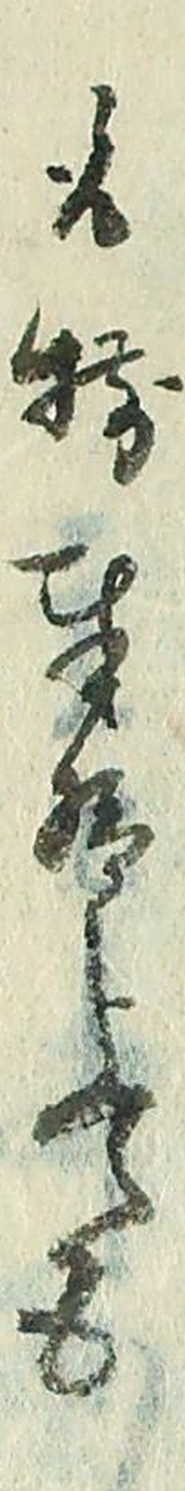取揃奉指上候以上
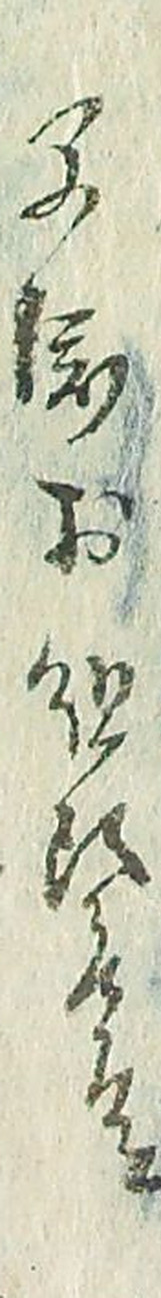早淵村組頭庄屋
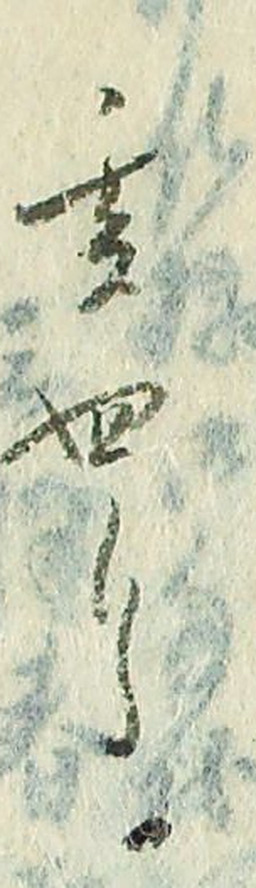亥四月
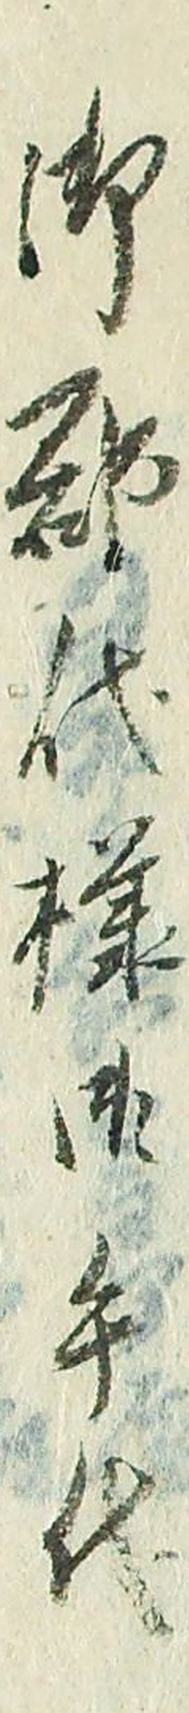御郡代様御手代
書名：諸御用御□受書控
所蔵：鳴門教育大学 Naruto University of Education
